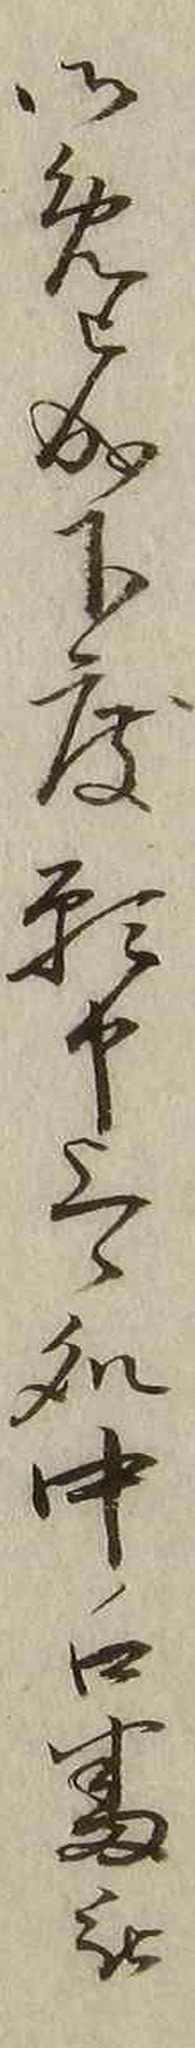御免被成下度願申上候処中ノ口番被
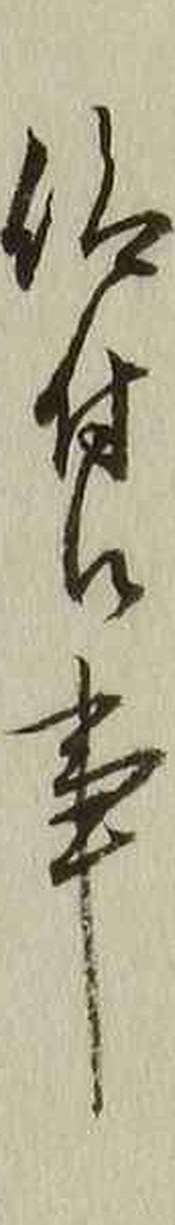仰付候事
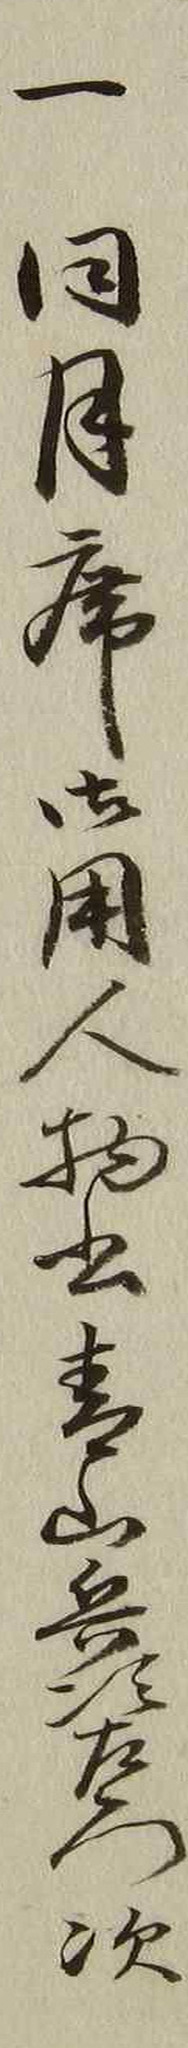一同月席御用人物書青山兵次左衛門次
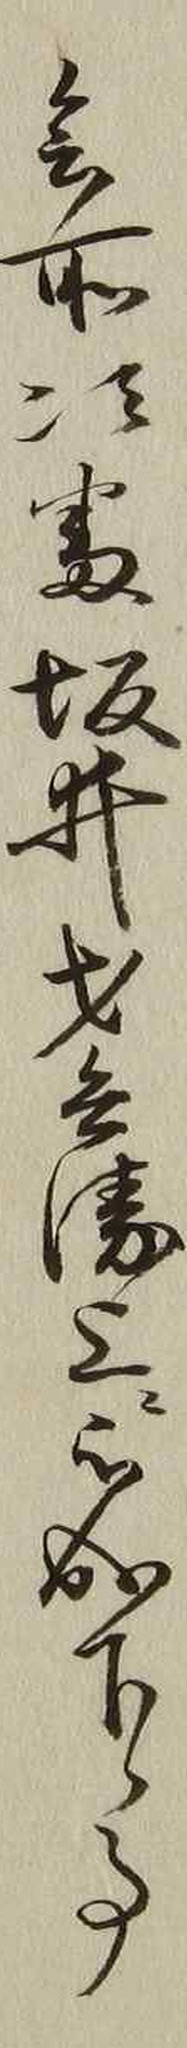会所次番坂井才兵衛上ニ被成下候事
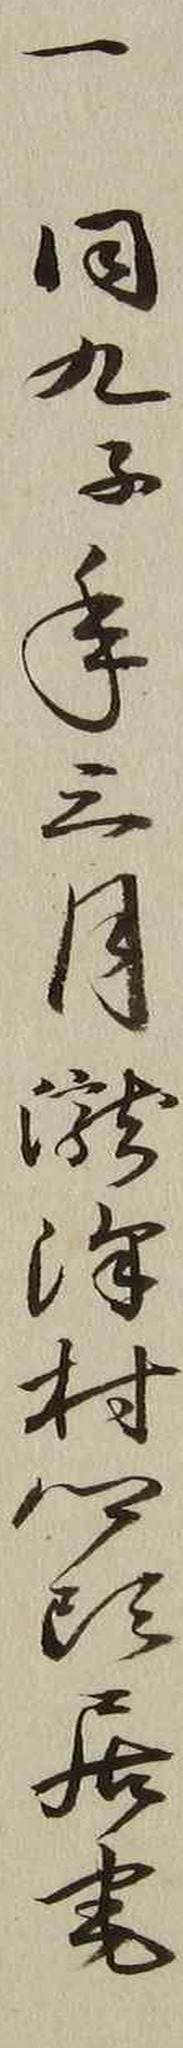一同九子年三月滝沢村郷頭居宅
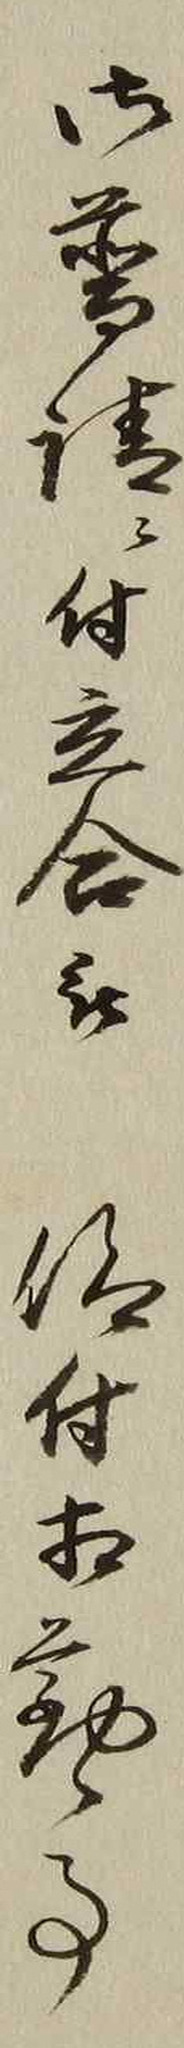御普請ニ付立合被仰付相勤候事
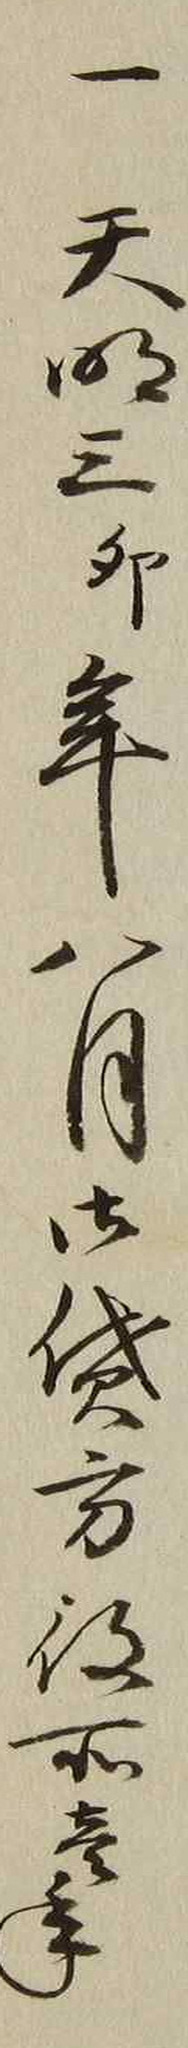一天明三卯年八月御貸方役所壱年
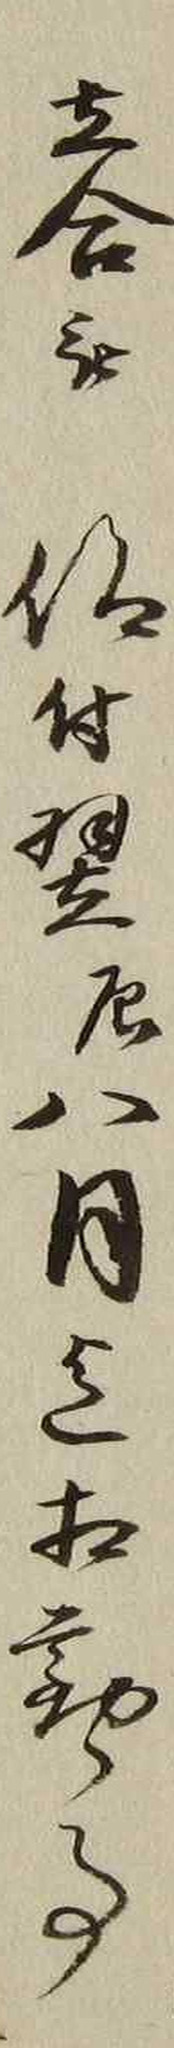立合被仰付翌辰八月迄相勤候事
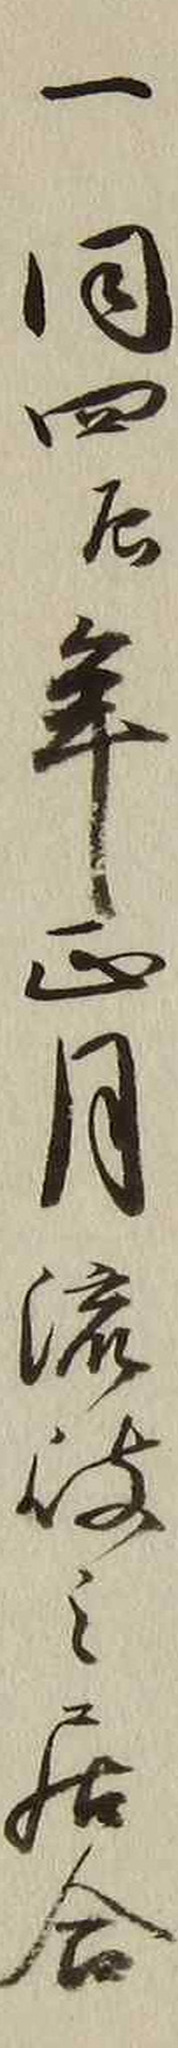一同四辰年正月流岐之居合
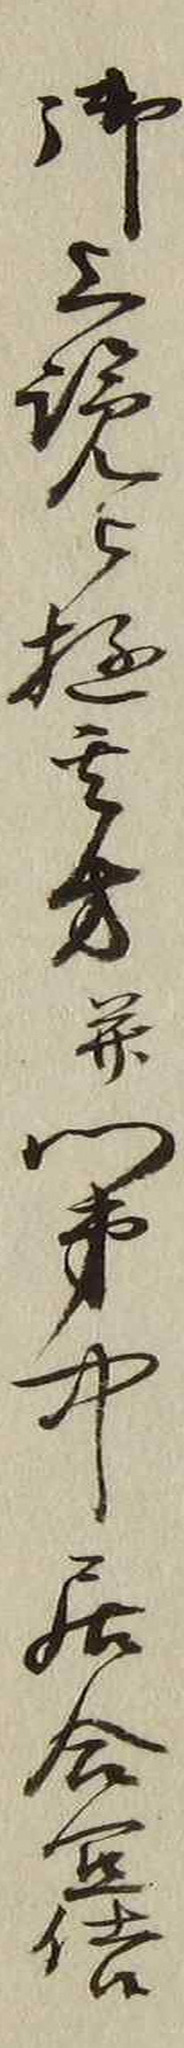御上覧被遊其方并門弟中居合宜仕候
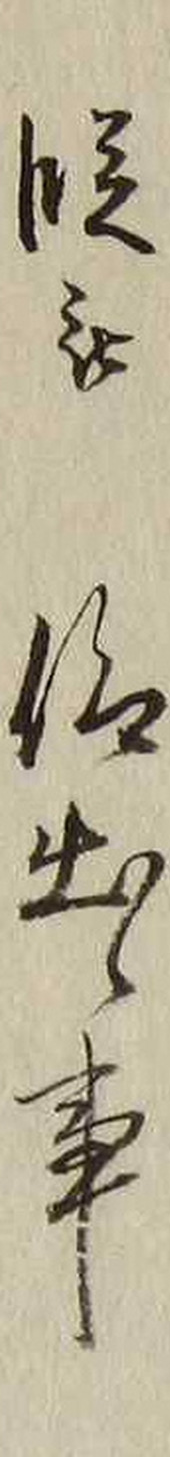段被仰出候事
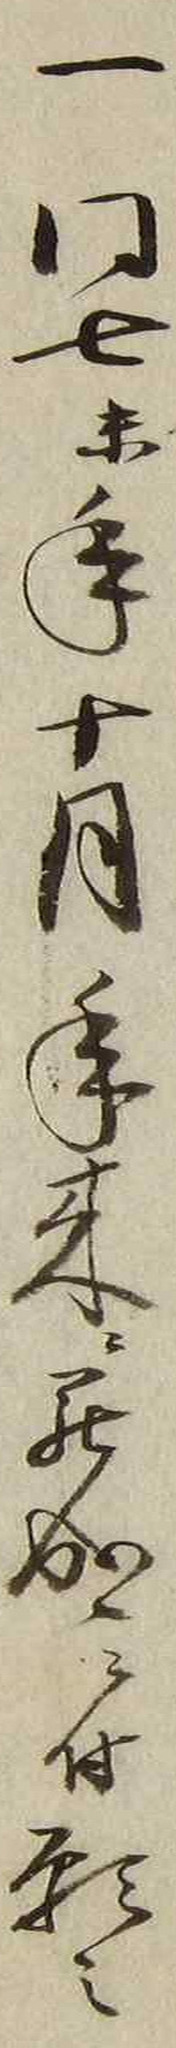一同七未年十月年来ニ罷成候ニ付願之
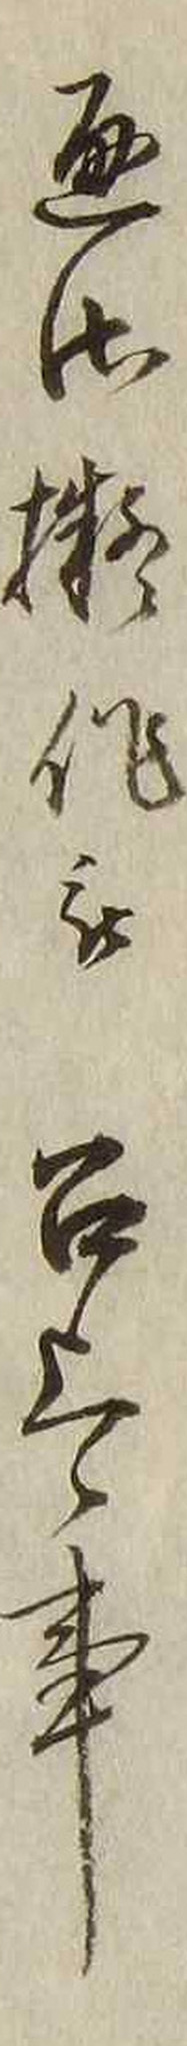通御擬作被召上候事
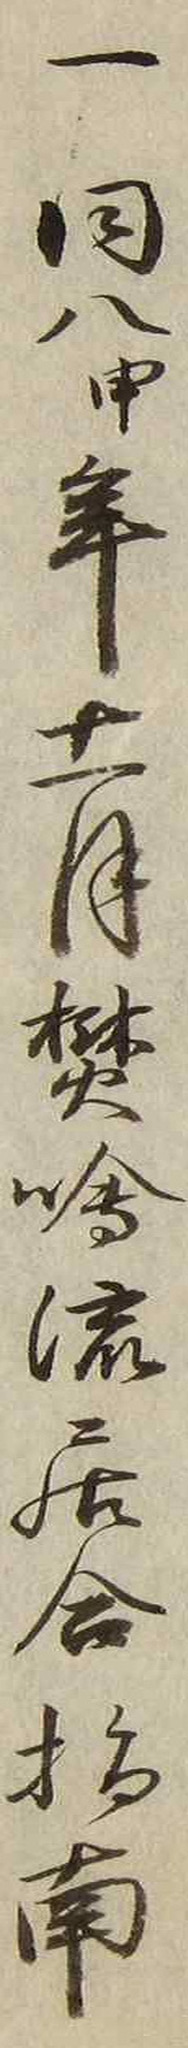一同八申年十一月樊噌流居合指南
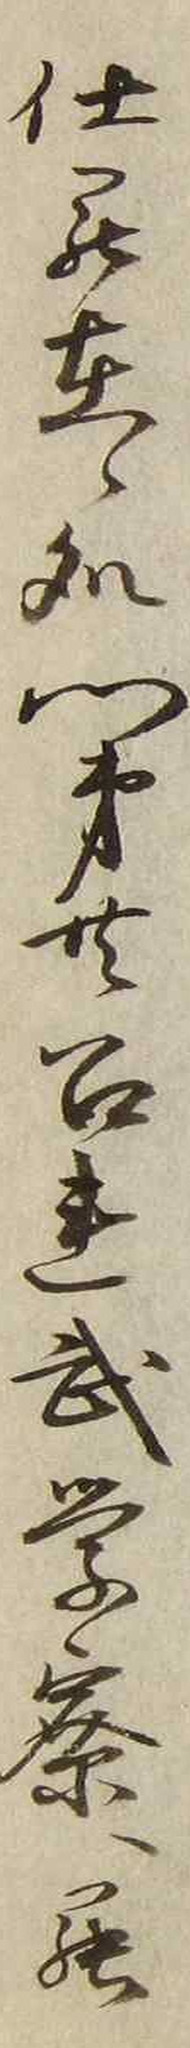仕罷在候処門弟共召連武学寮へ罷

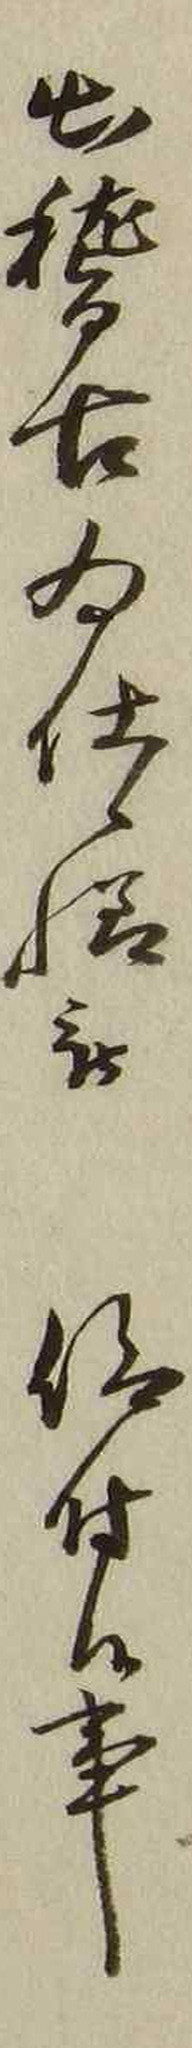出稽古為仕候様被仰付候事
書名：諸士系譜　巻之102　か之部10
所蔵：会津若松市立会津図書館
